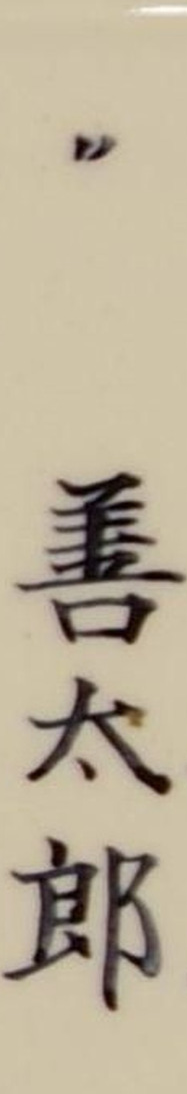善太郎
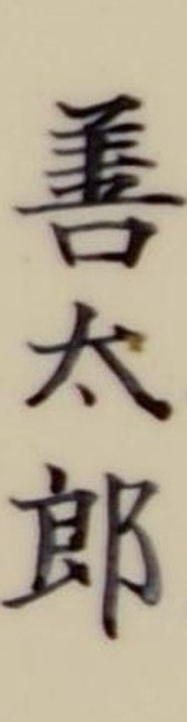善太郎
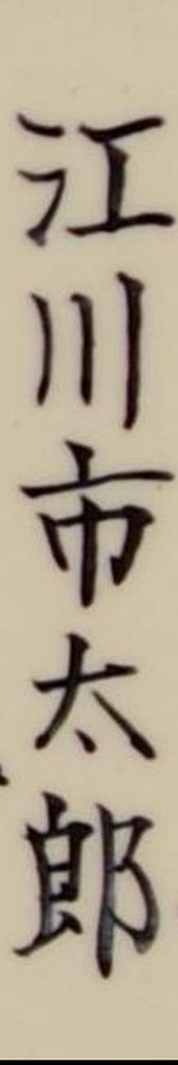江川市太郎
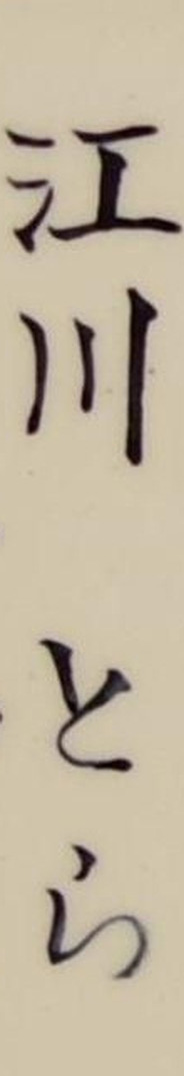江川とら
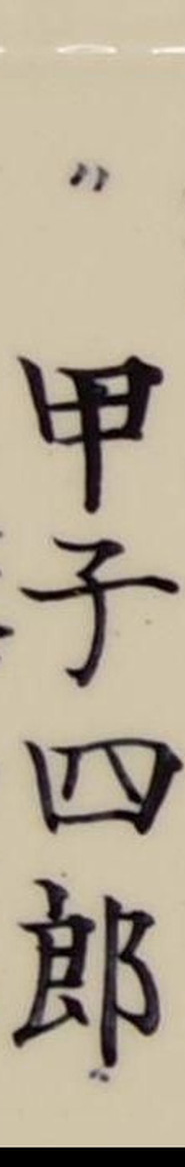甲子四郎
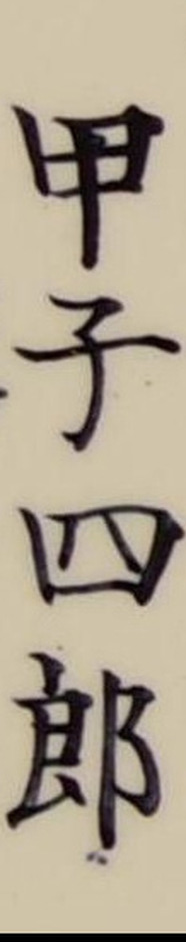甲子四郎
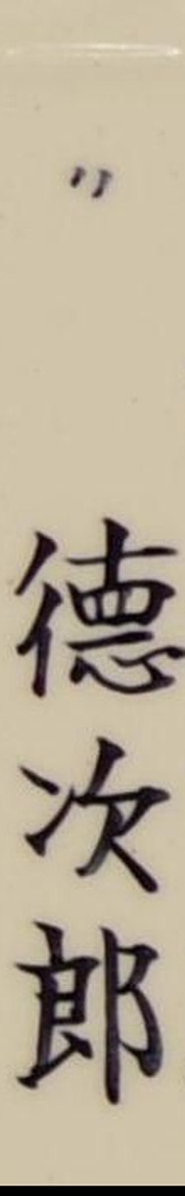徳次郎
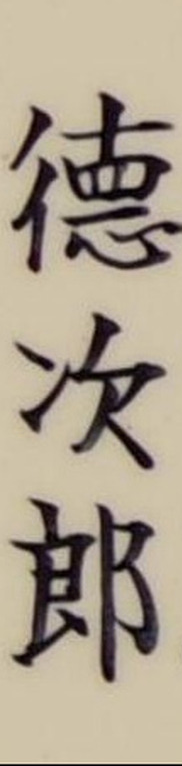徳次郎
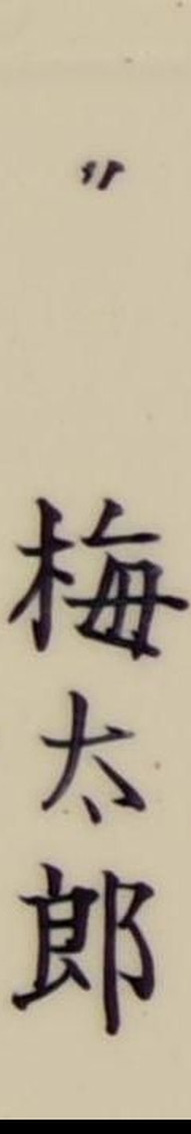梅太郎
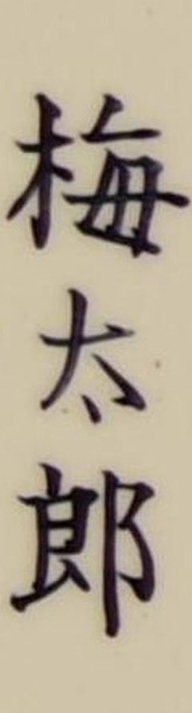梅太郎
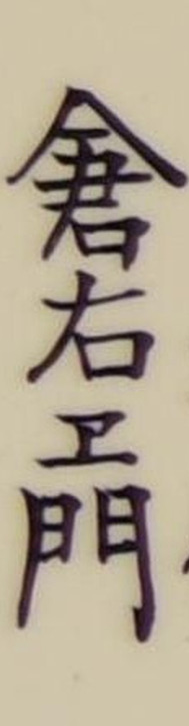倉右ヱ門
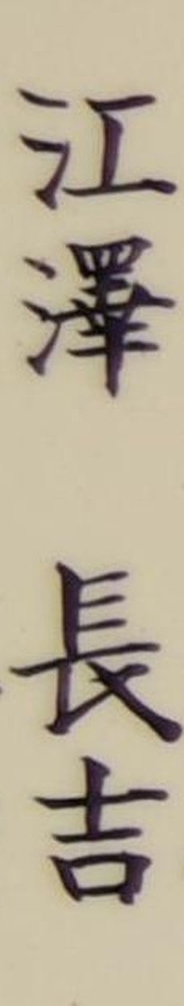江澤長吉

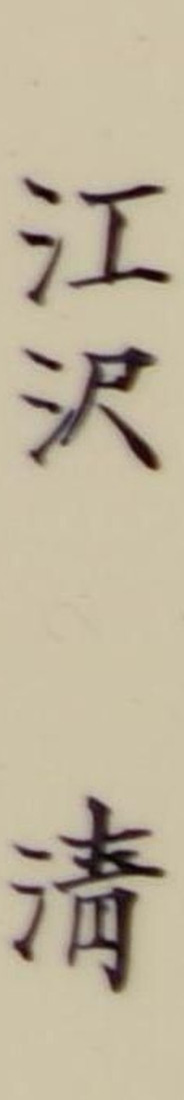江沢清
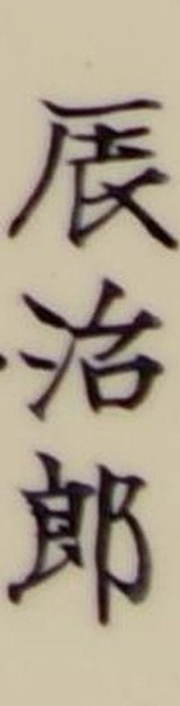辰治郎
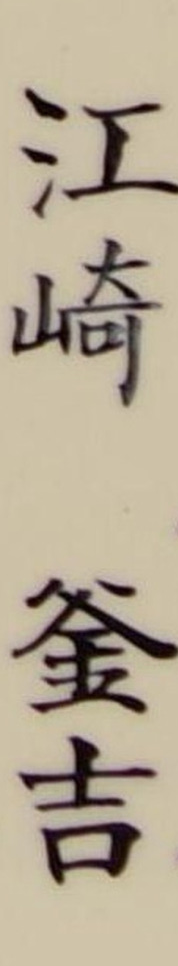江崎釜吉
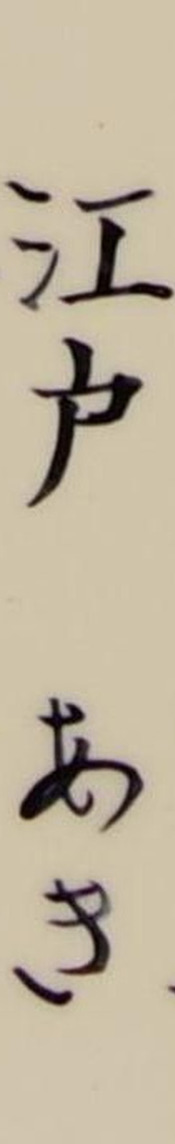江戸あき
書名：E~L
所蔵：高野山金剛峯寺
